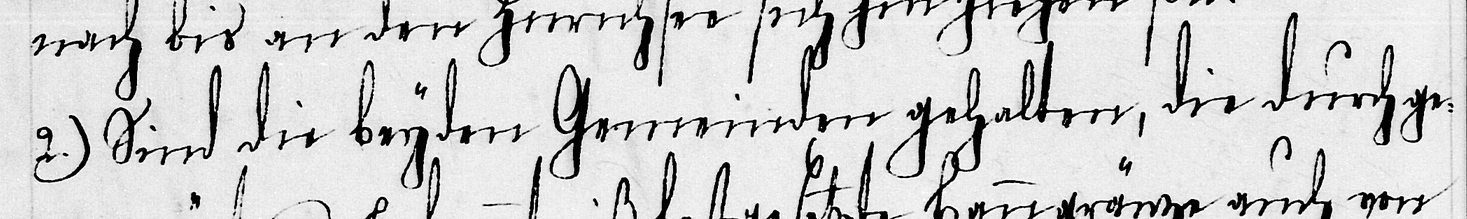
2.) Sind die beyden Gemeinden gehalten, die durch g¬
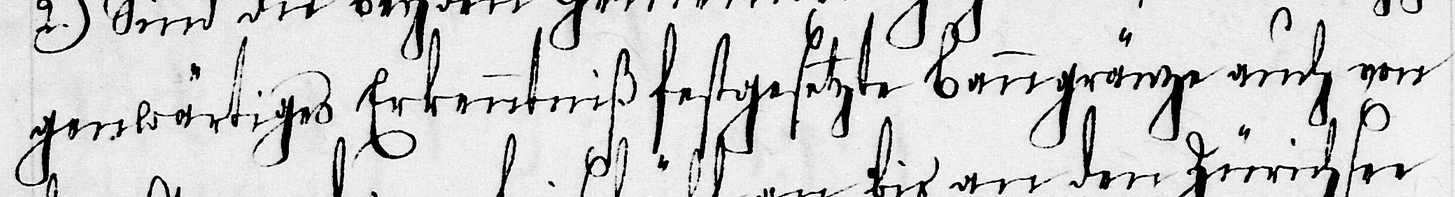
egenwärtiges Erkenntniß festgesetzte Banngränze auch von
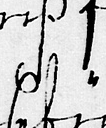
4.)
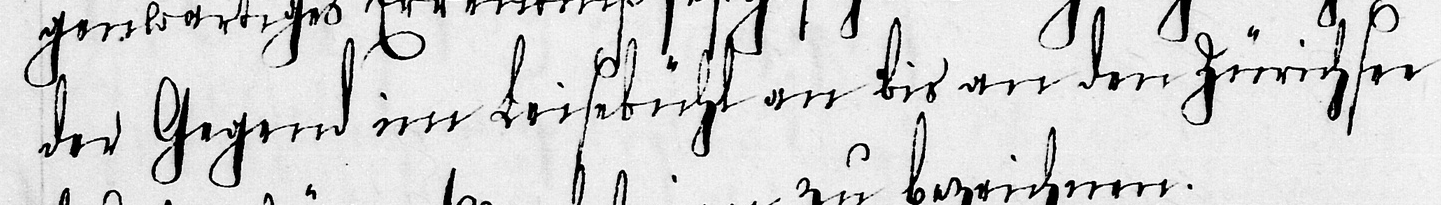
der Gegend im Leisebühl an bis an den Zürichsee
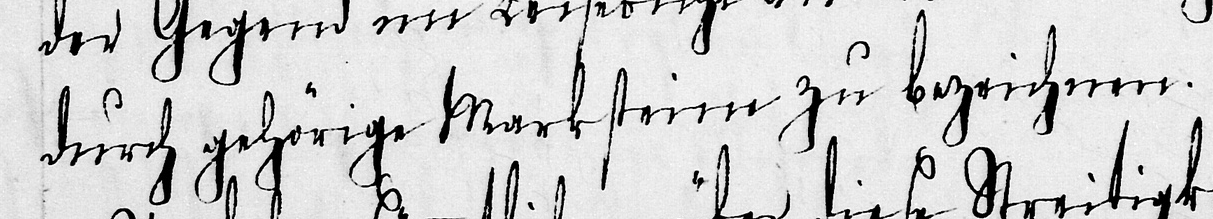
durch gehörige Marksteine zu bezeichnen.
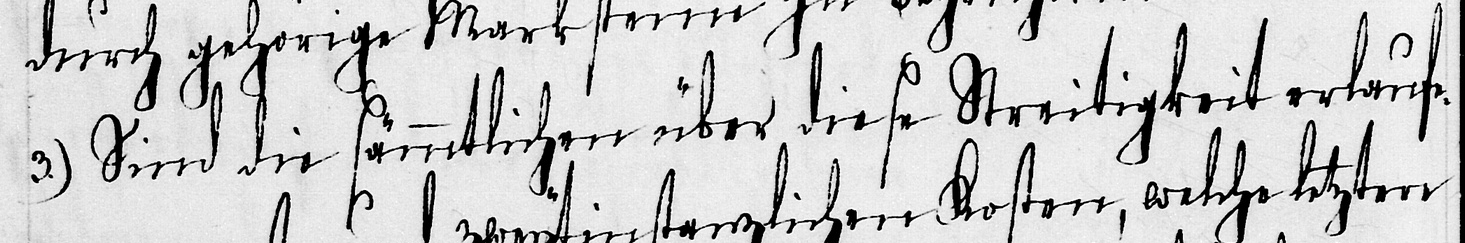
3.) Sind die sämmtlichen über diese Streitigkeit erlauf¬
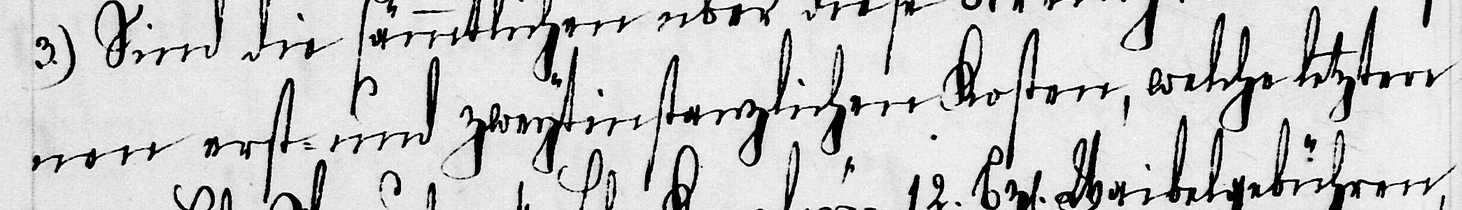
enen erst- und zweytinstanzlichen Kosten, welche letztere
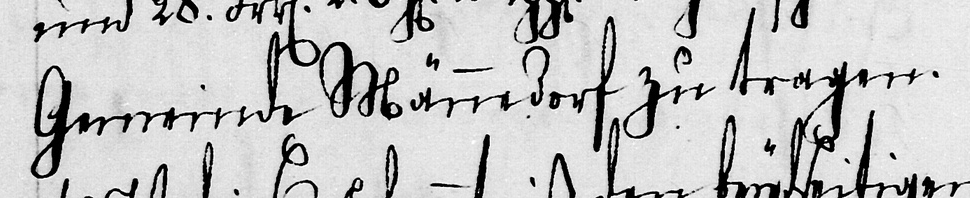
Gemeinde Männedorf zu tragen.
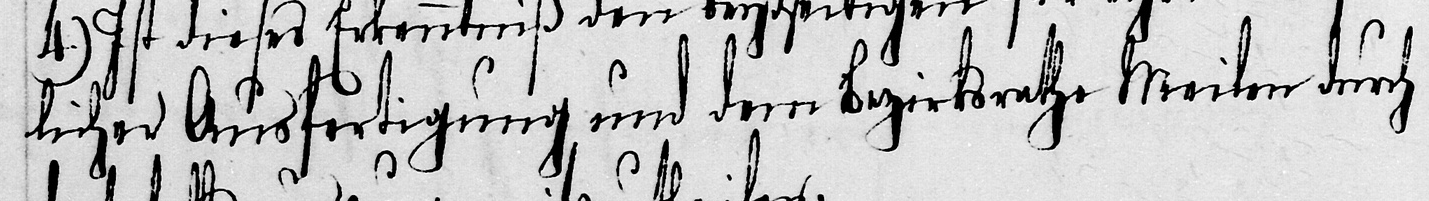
licher Ausfertigung und dem Bezirksrathe Meilen durch
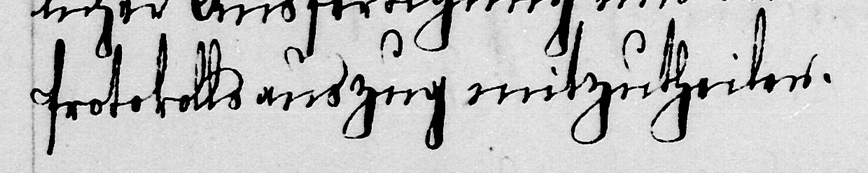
Protokollsauszug mitzutheilen.
